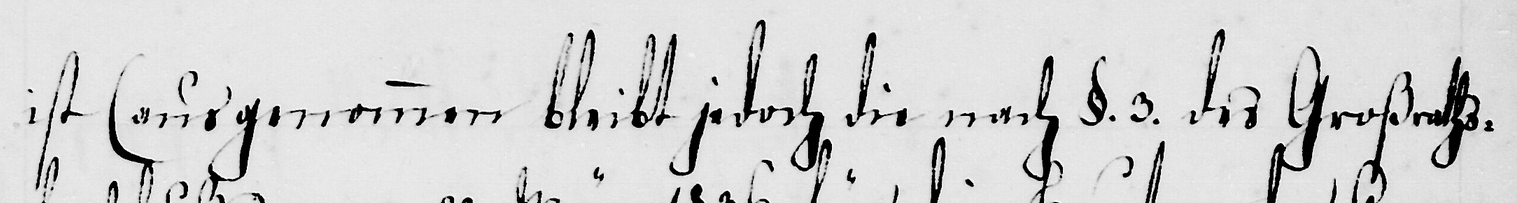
ist (ausgenommen bleibt jedoch die nach §. 3. des Großrath¬
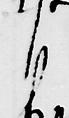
t.
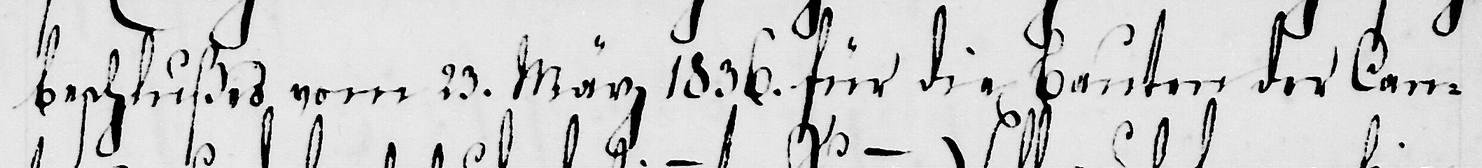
sbeschlußes vom 23. März 1836. für die Bauten der Can¬
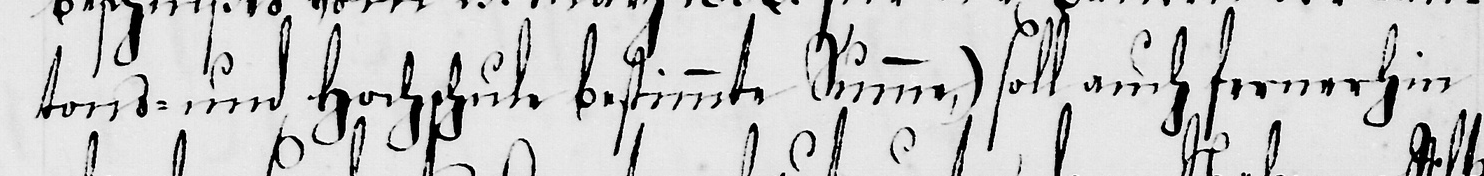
tons- und Hochschule bestimmte Summe,) soll auch fernerhin
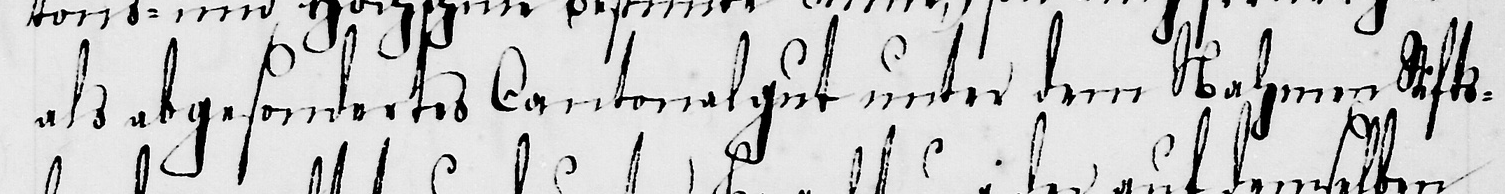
als abgesondertes Cantonalgut unter dem Nahmen Stift¬
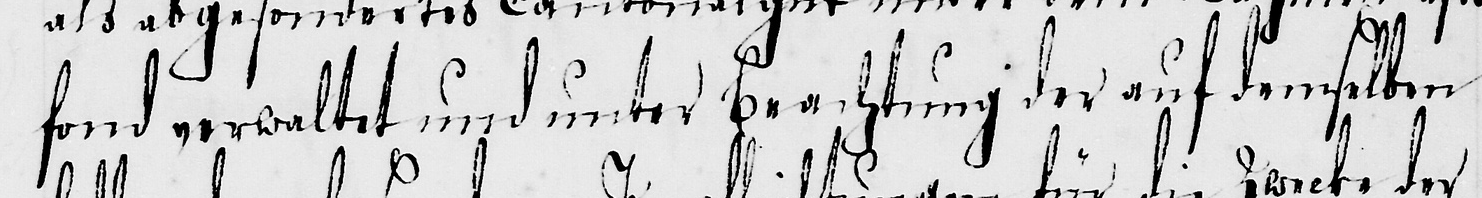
fond verwaltet und unter Beachtung der auf demselben
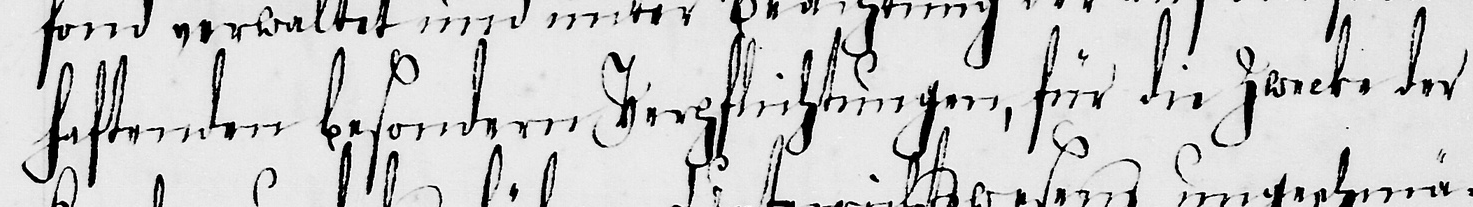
haftenden besondern Verpflichtungen, für die Zwecke der
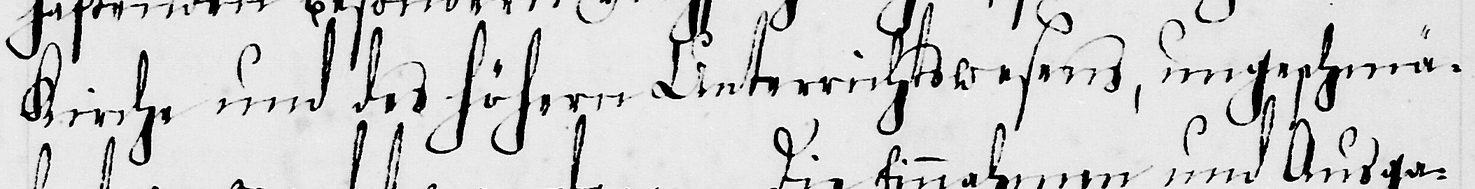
Kirche und des Höhern Unterrichtswesens, ungeschmä¬
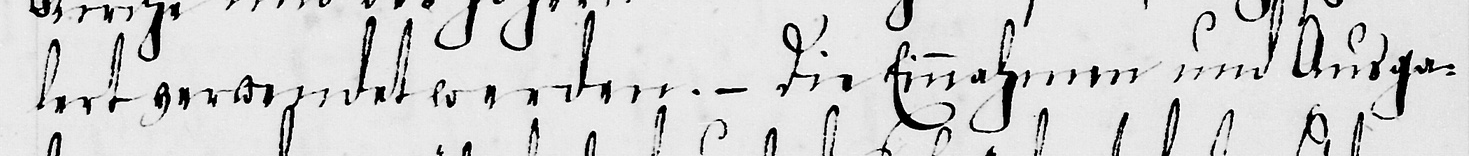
lert verwendet werden. – Die Einnahmen und Ausga¬
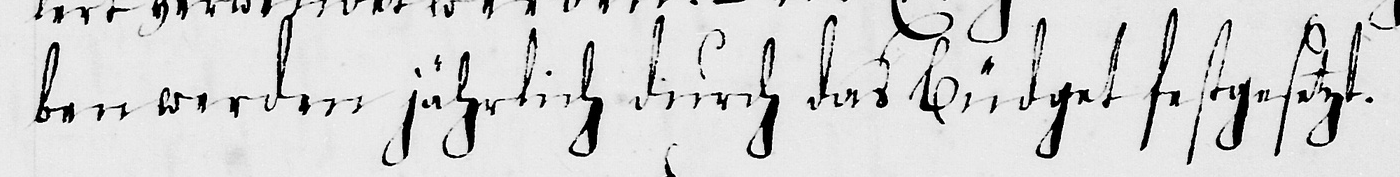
ben werden jährlich durch das Büdget festgesetz¬
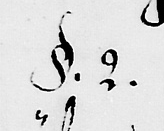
§. 2.
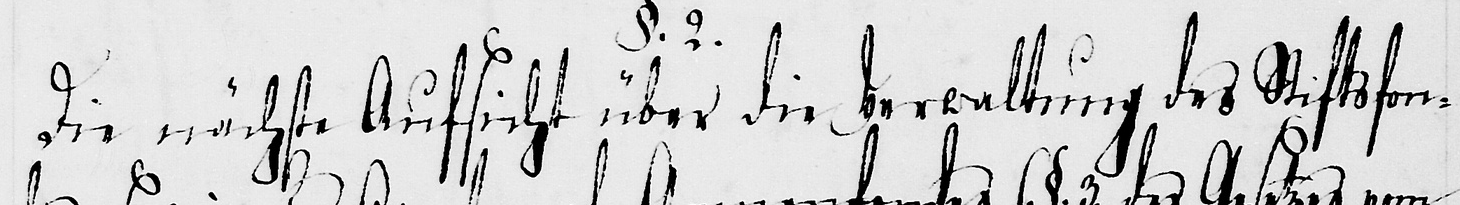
Die nächste Aufsicht über die Verwaltung des Stiftsfo¬
